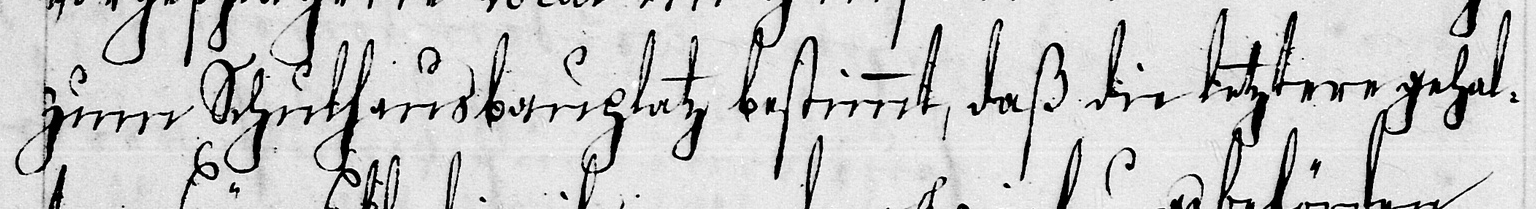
zum Schulhausbauplatz bestimmt, daß die letztere geha¬
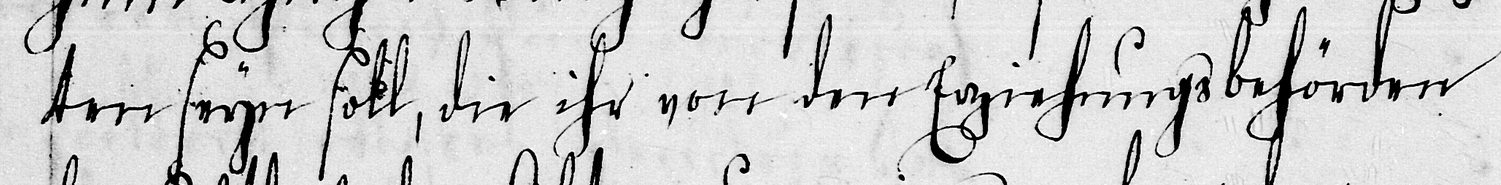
lten seyn soll, die ihr von den Erziehungsbehörden
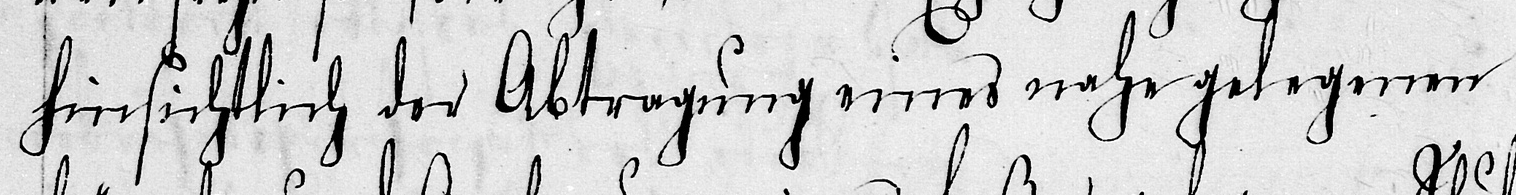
hinsichtlich der Abtragung eines nahe gelegenen
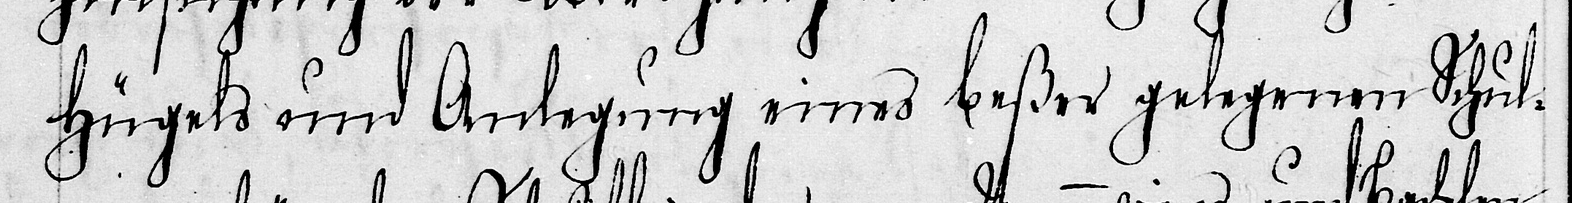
Hügels und Anlegung eines beßer gelegenen Schul¬
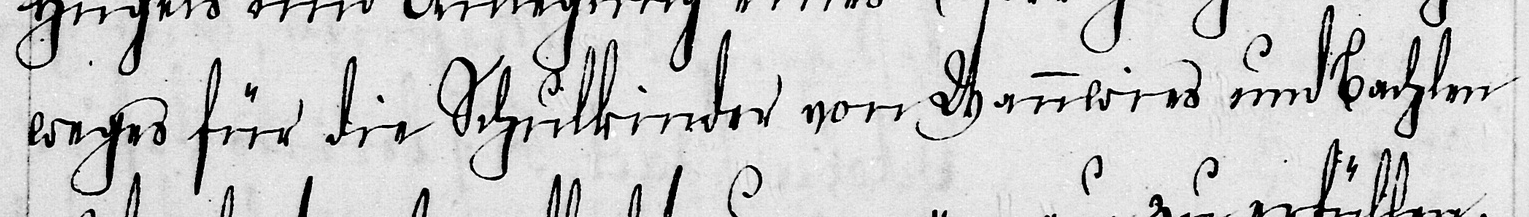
weges für die Schulkinder von Wannwies und Bachlen
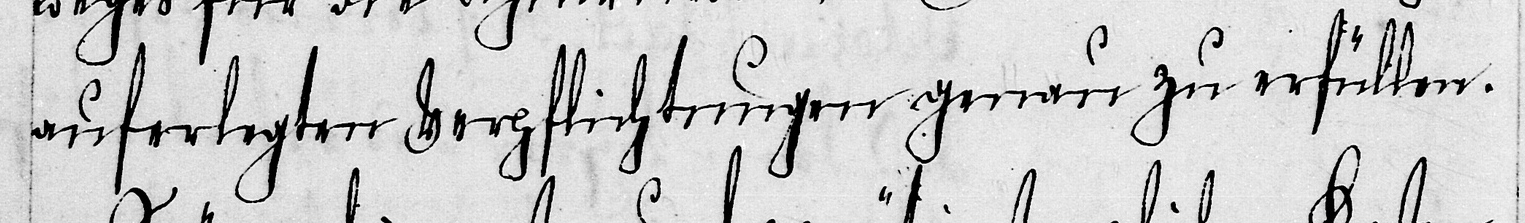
auferlegten Verpflichtungen genau zu erfüllen.
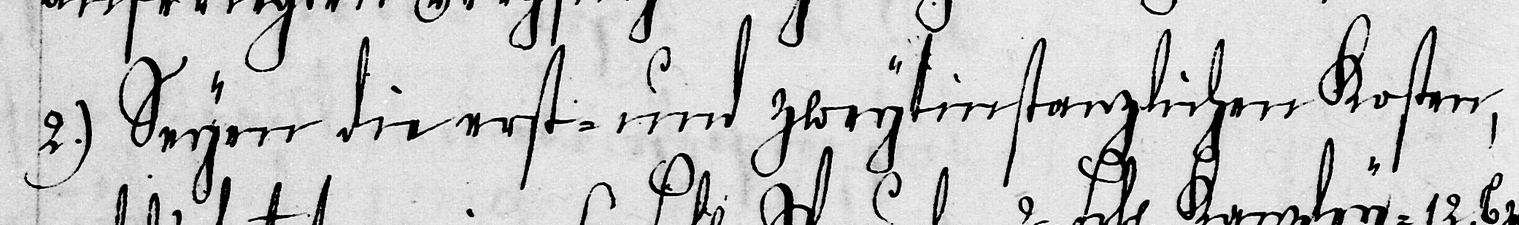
2.) Seyen die erst- und zweytinstanzlichen Kosten,
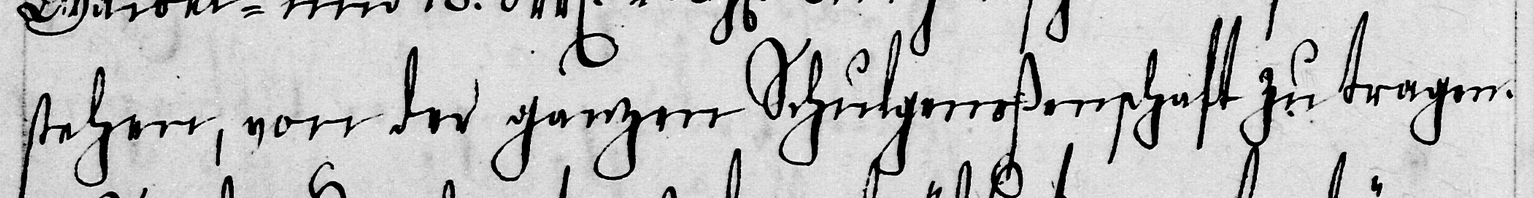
stehen, von der ganzen Schulgenoßenschaft zu tragen.
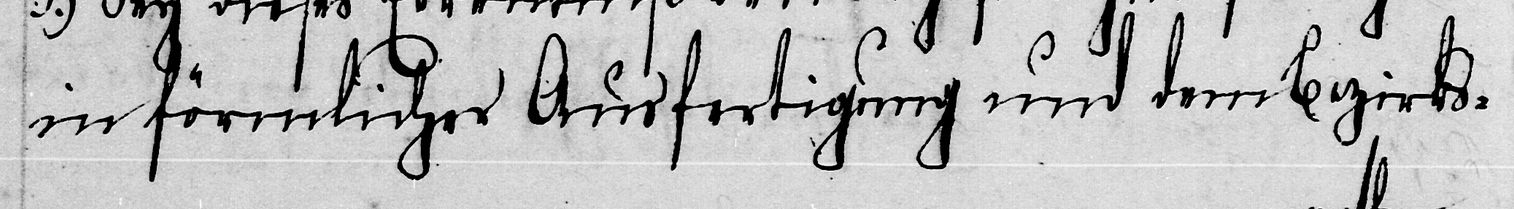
in förmlicher Ausfertigung und dem Bezirks-
